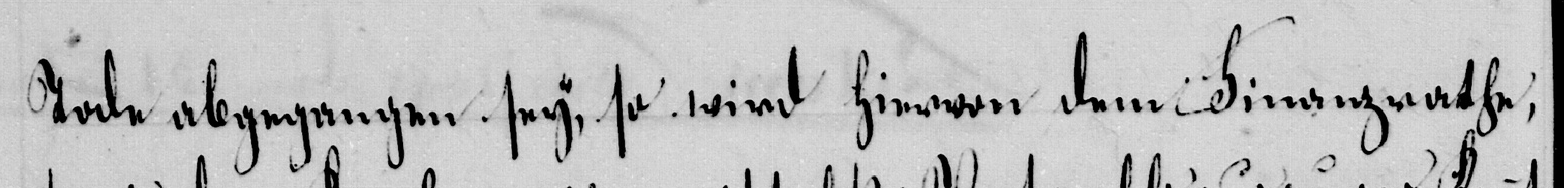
Tode abgegangen sey, so wird hiervon dem Finanzrathe,
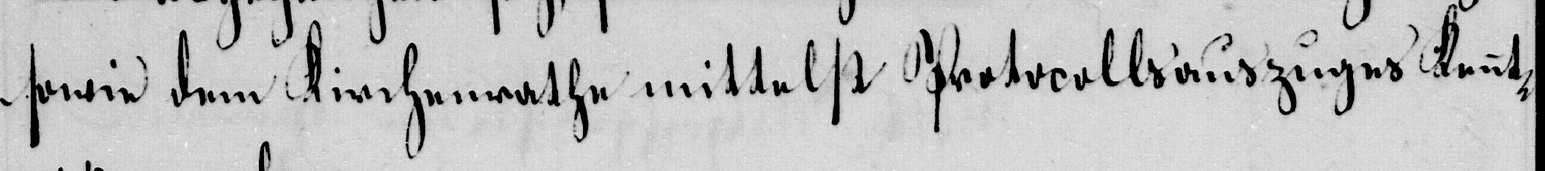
sowie dem Kirchenrathe mittelst Protocollsauszuges Kennt¬
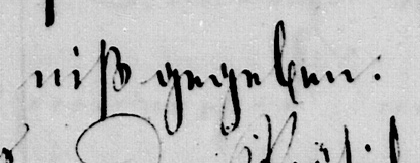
niß gegeben.
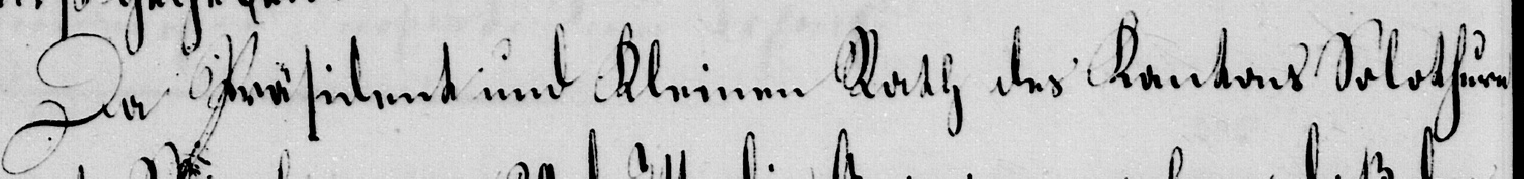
Da Präsident und Kleiner Rath des Kantons Solothurn
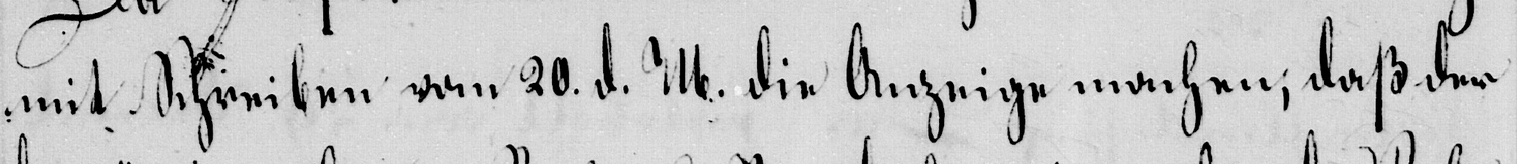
mit Schreiben vom 20. d. M. die Anzeige machen, daß der
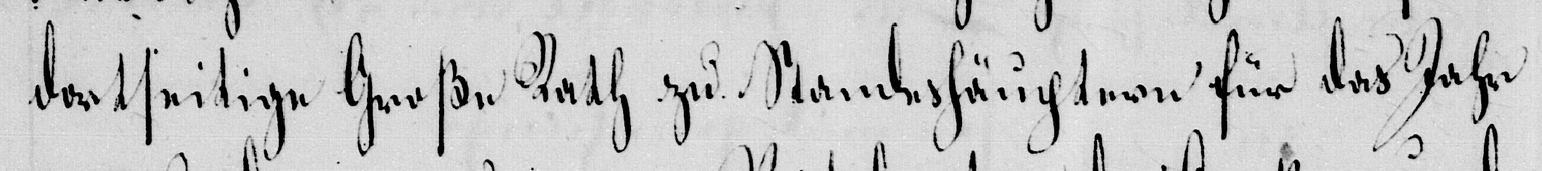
dortseitige Große Rath zu Standeshäuptern für das Jahr
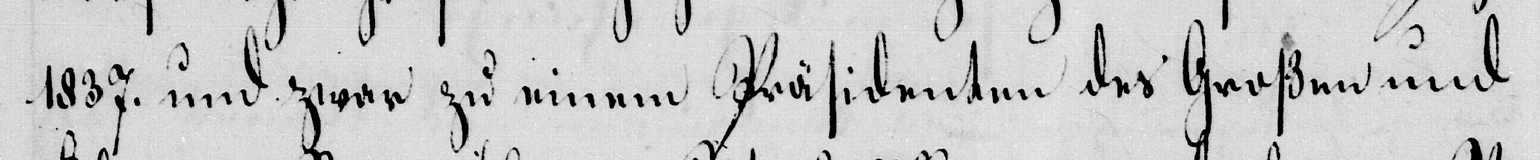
1837. und zwar zu einem Präsidenten des Großen und
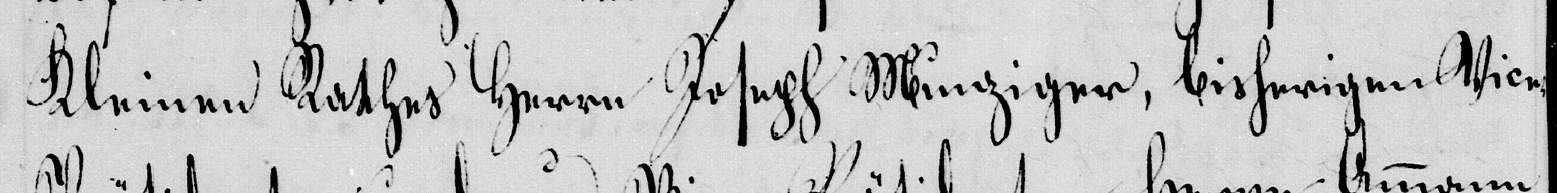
Kleinen Rathes Herrn Joseph Munziger, bisherigen Vic¬
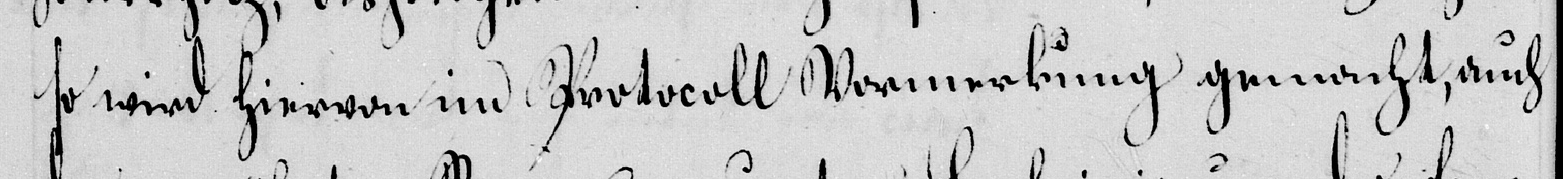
so wird hiervon im Protokoll Vormerkung gemacht, auch
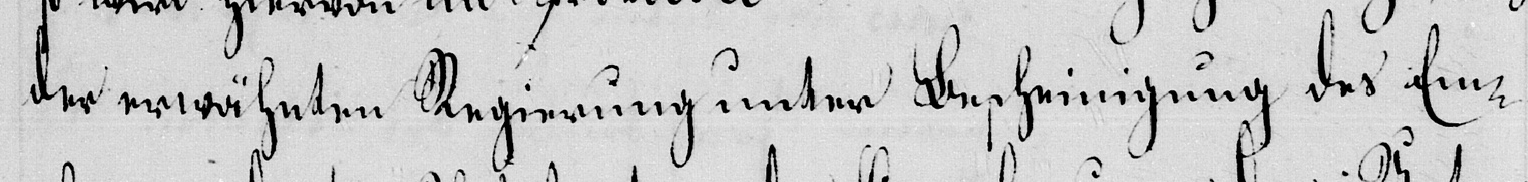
der erwähnten Regierung unter Bescheinigung des Em¬
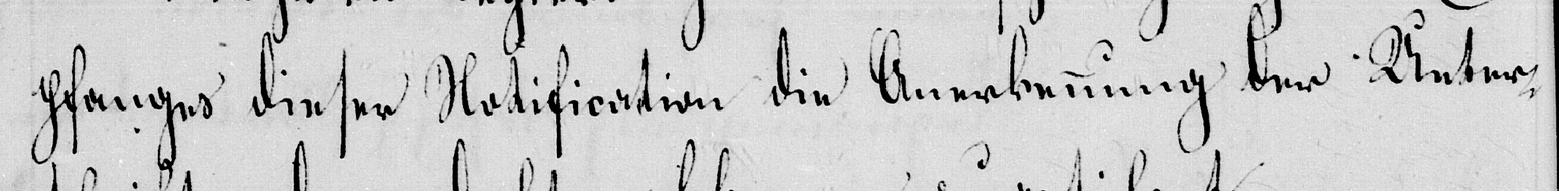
pfanges dieser Ratification die Anerkennung der Unter¬
